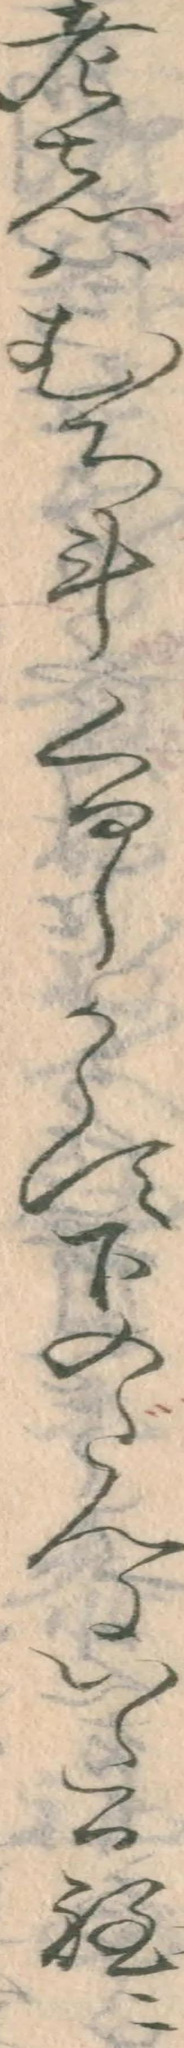老者はむち計くるしからす下のだんにいたる程に
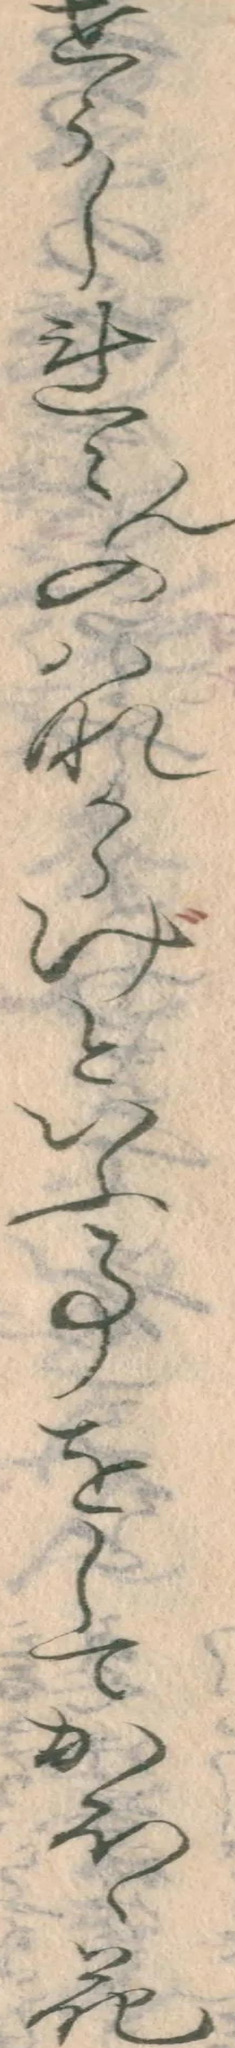せうし連々んのはなからけといふ事をしてかほゝ花
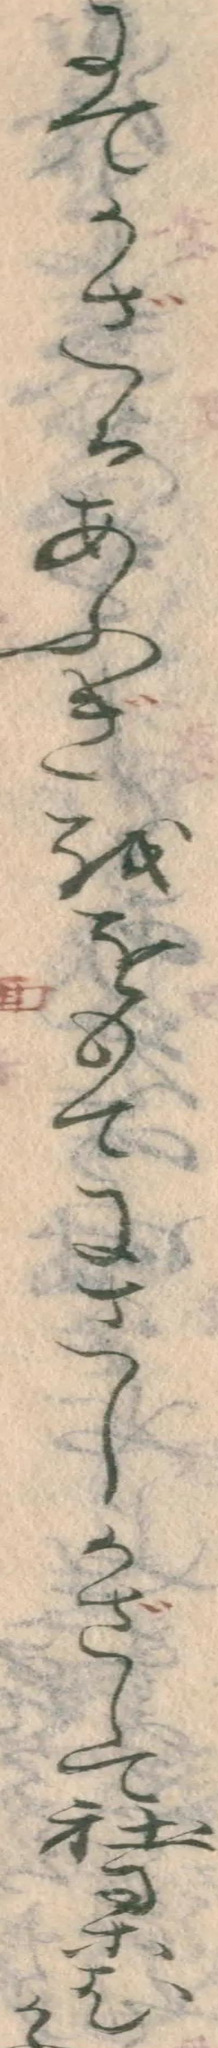にてかざるあふぎををもてにさしかざして社司等むかふ
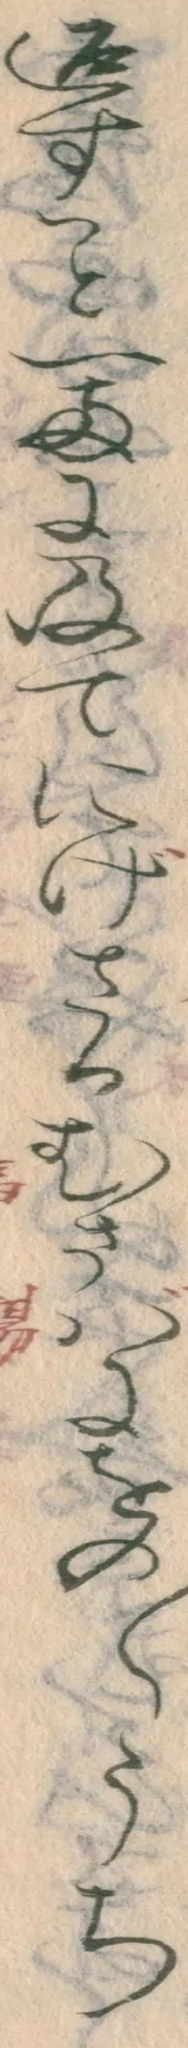返すこと一両に及てにげさるむまばにをの〳〵うち
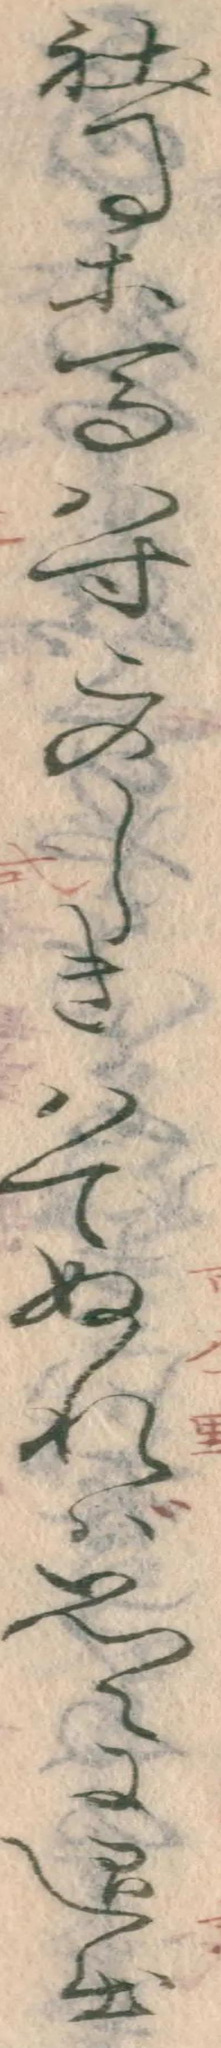社司等馬はすこのしきはてぬれば思々に退出
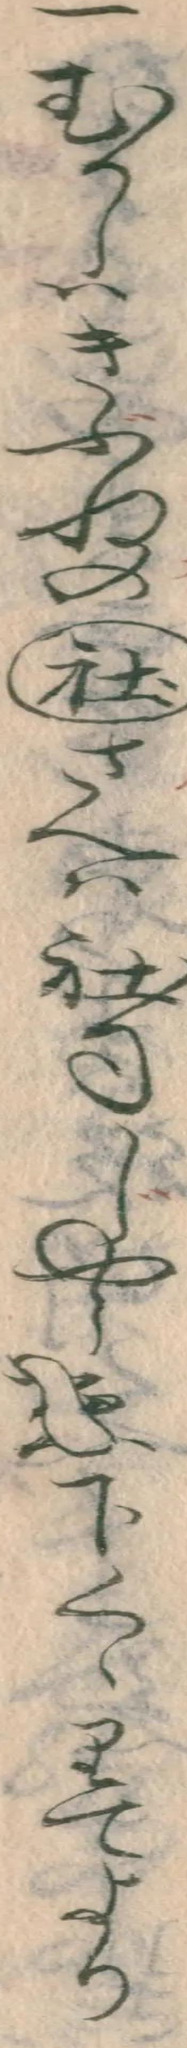一むかしはきぶねの㊓まへは社司じやうゑ下くゝりてより
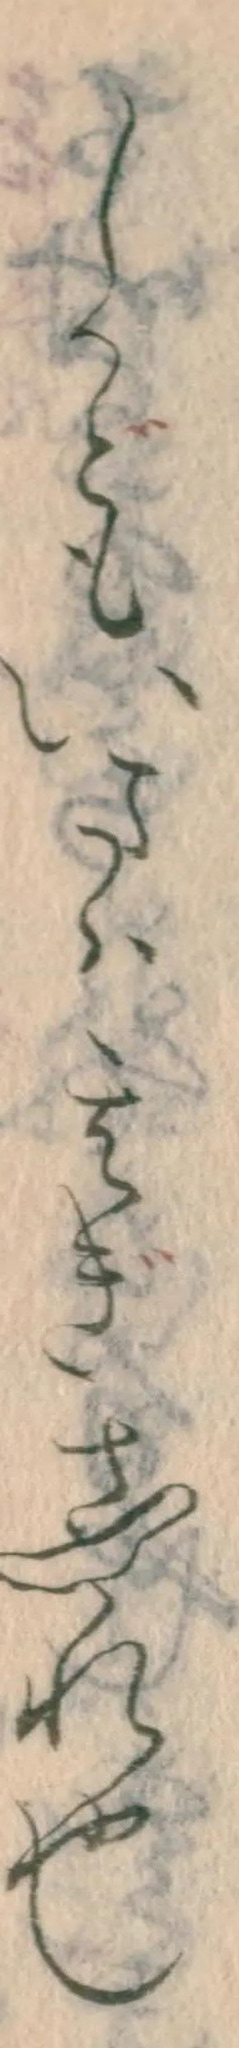しかどもいまは其ぎまれ也
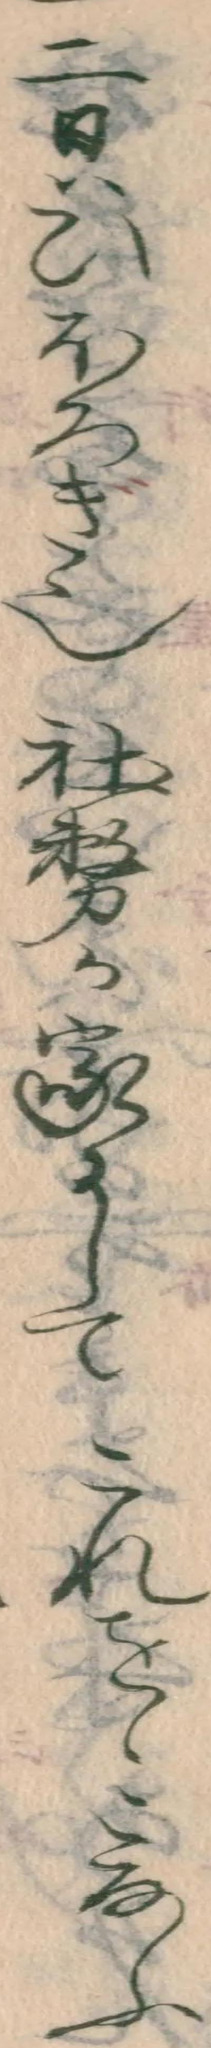一二日はひほろぎ也社務か家にしてこれをゝこなふ
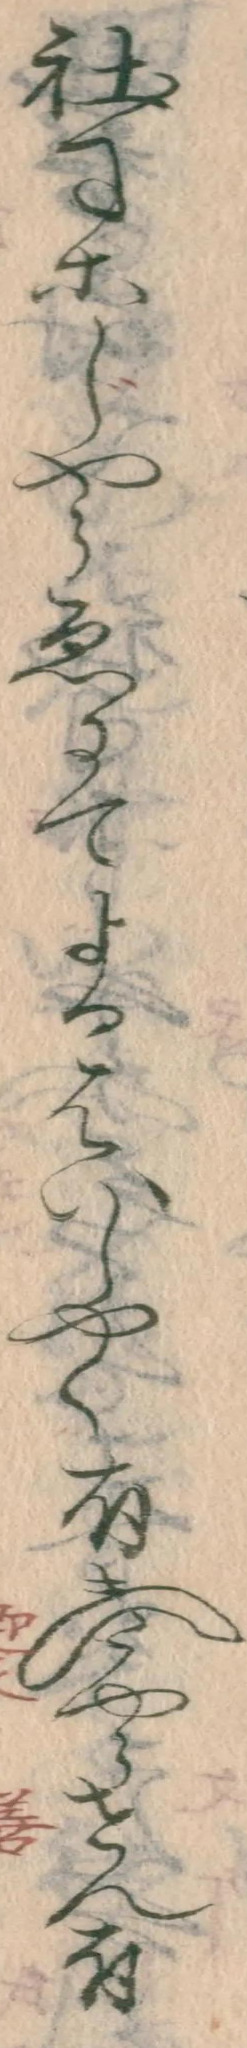社司等じやうゑにてよるはいしやく有きやうせん有
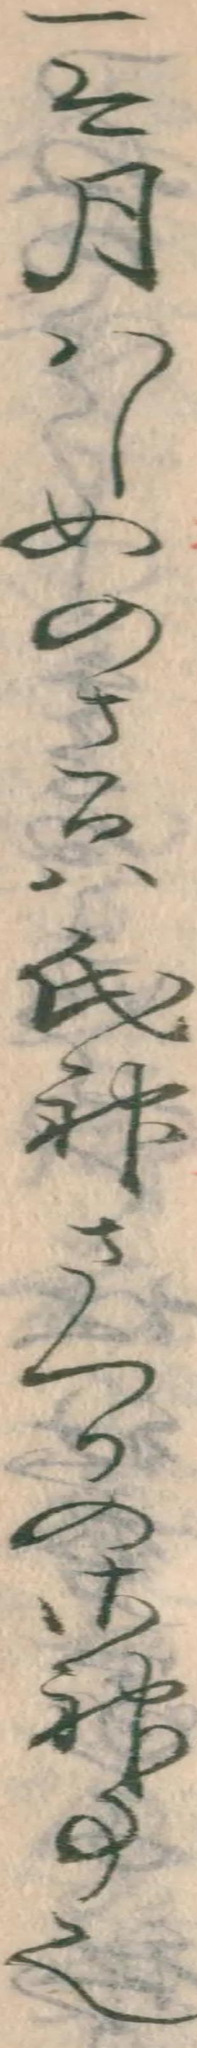一今月はしめのさるは氏神まつりの御神事也
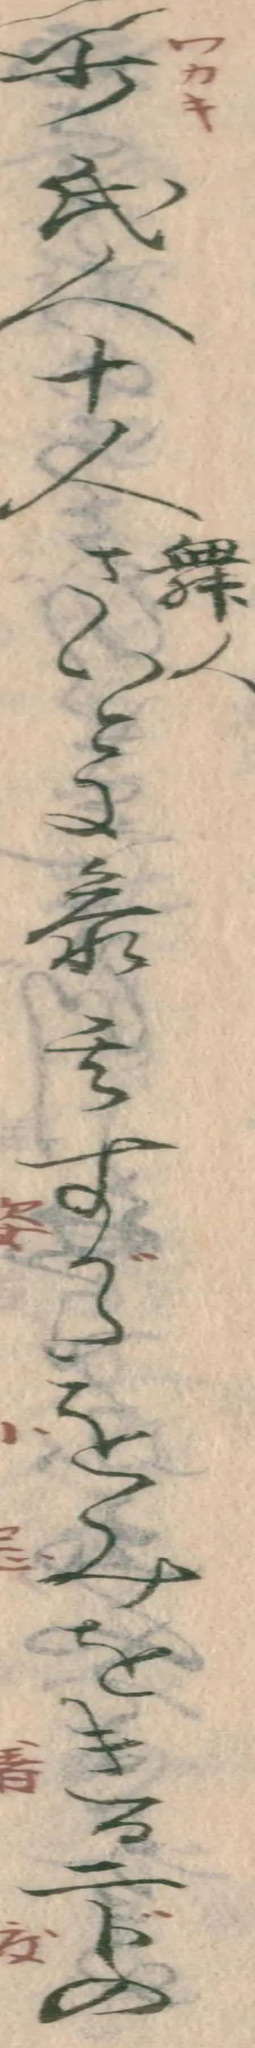少氏人十人まいとに参其すがたをみをきる二ドの
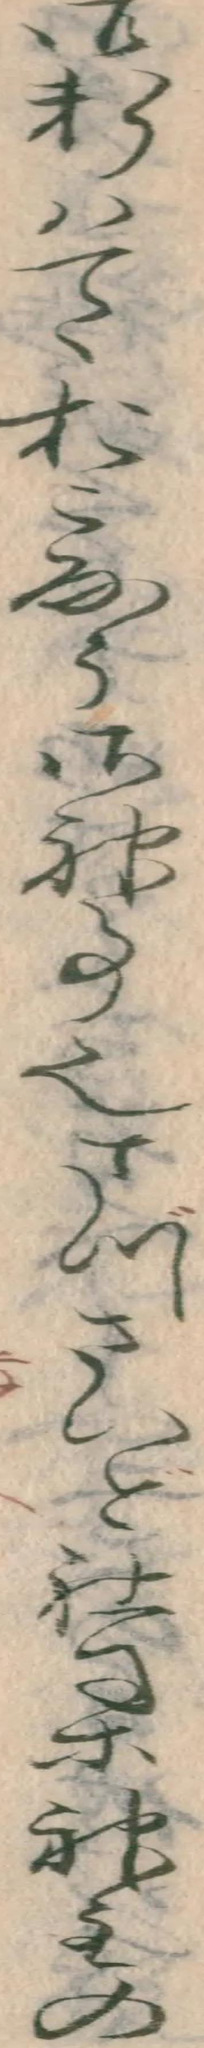御料はてゝおこなう御神事也まづまいど社司等神主の
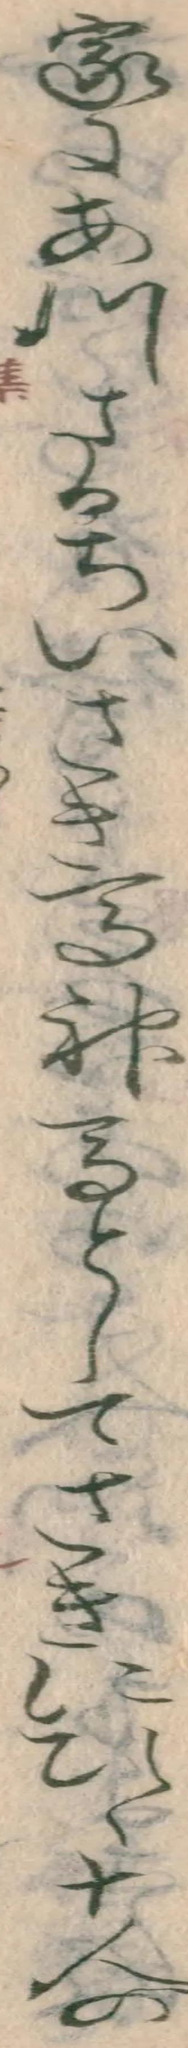家にあつまるちいさき馬神馬としてさきにひく十人の
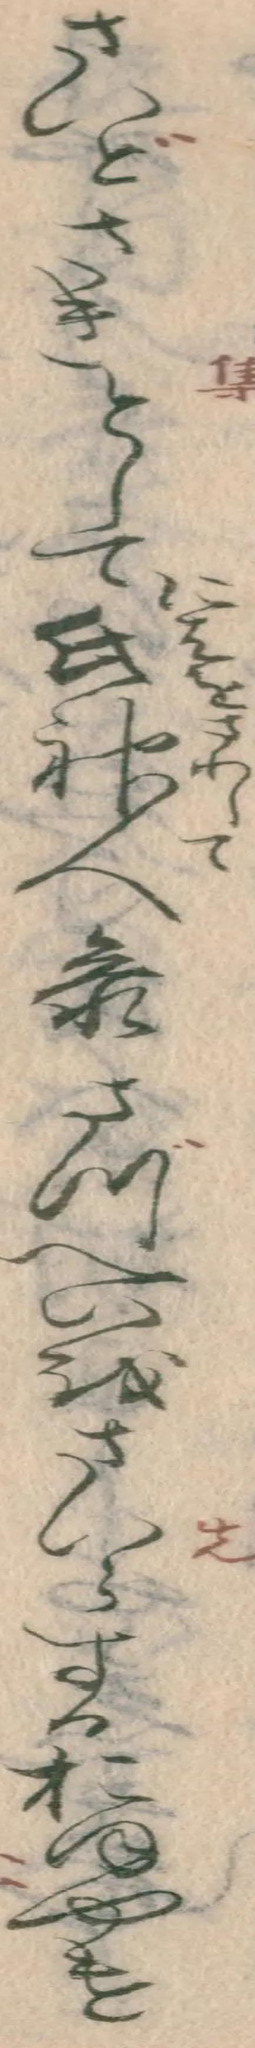まいどさきとして氏神人参まづへいをまいらするおほやけ
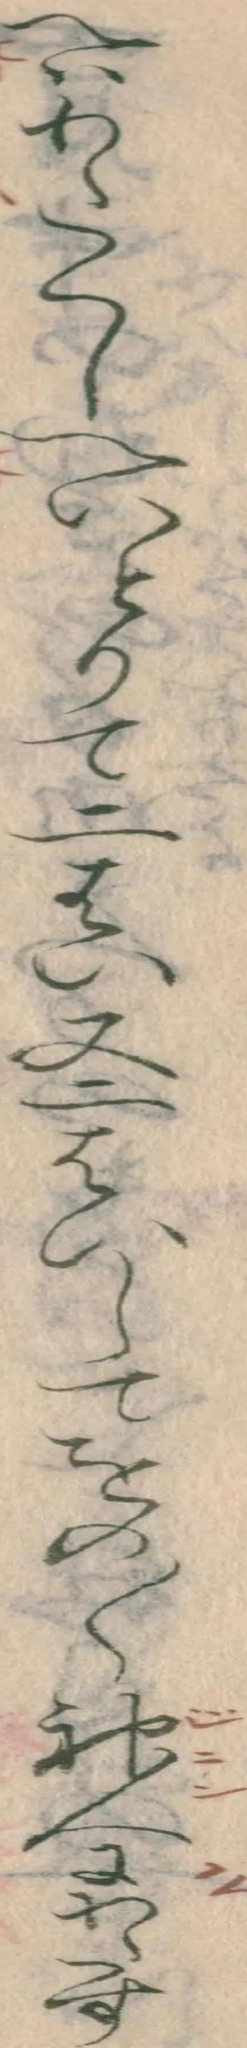へいわたくしへいとりて二はい又二はいしてをの〳〵神人にわたす
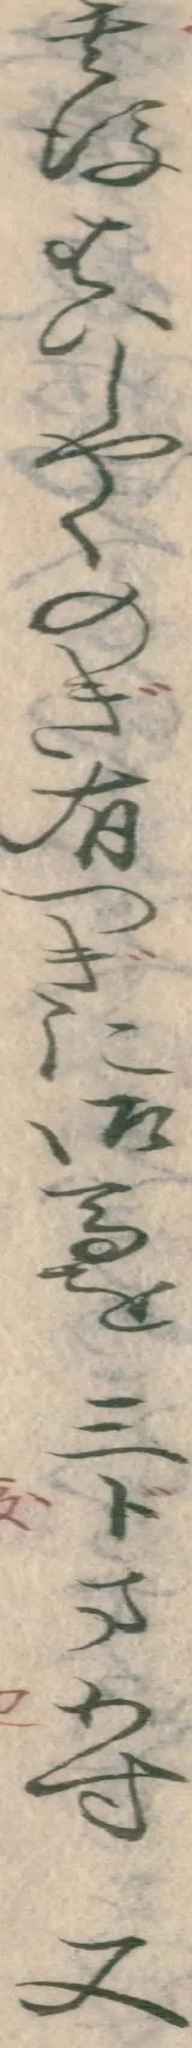其後はいしやくのぎ有つぎに御馬を三ドまわす又
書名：賀茂社記録. 第3冊
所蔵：国立国会図書館 National Diet Library, JAPAN
